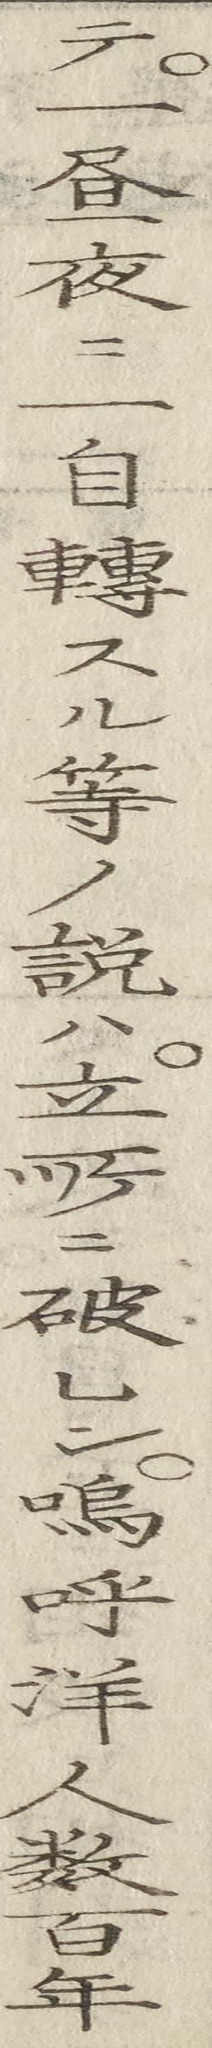テ。一昼夜ニ一自転スル等ノ説ハ。立所ニ破レン。嗚呼洋人数百年
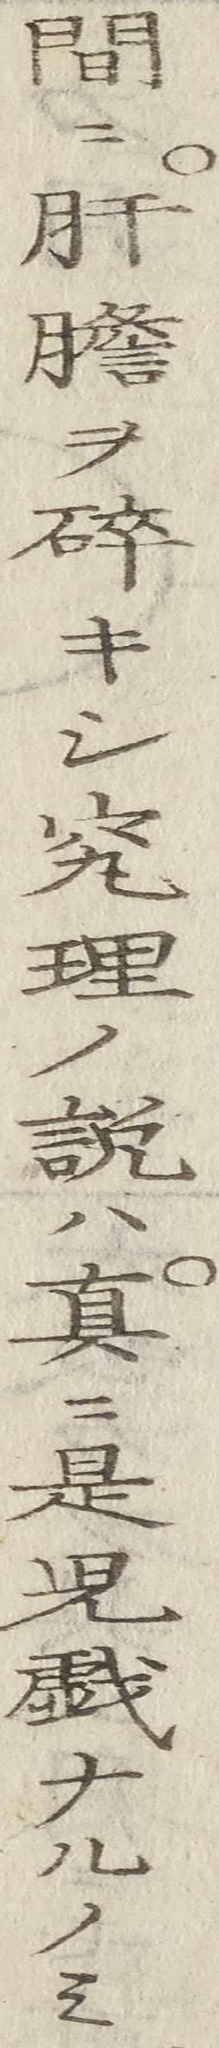間ニ。肝胆ヲ砕キシ究理ノ説ハ。真ニ是児戯ナルノミ。
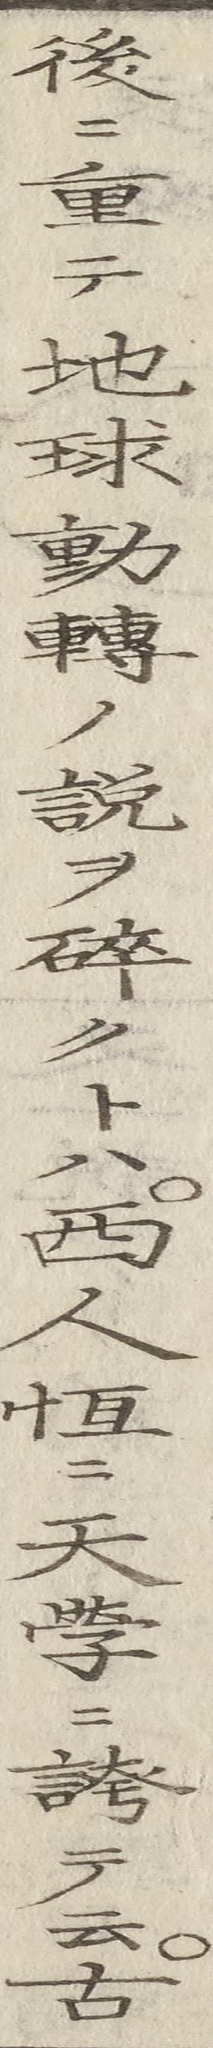後ニ重テ地球動転ノ説ヲ砕クトハ。西人恆ニ天学ニ誇テ云。古
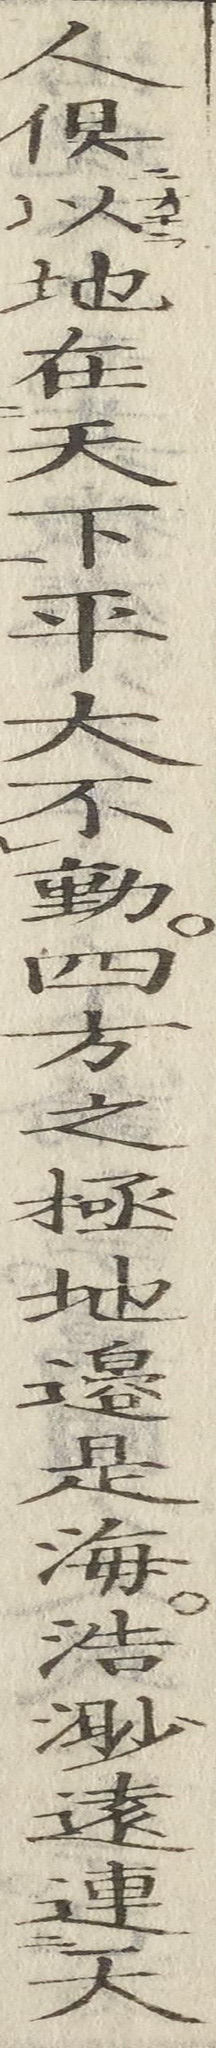人俱二以地在天下平大不動。四方之極地辺是海。浩渺遠連天
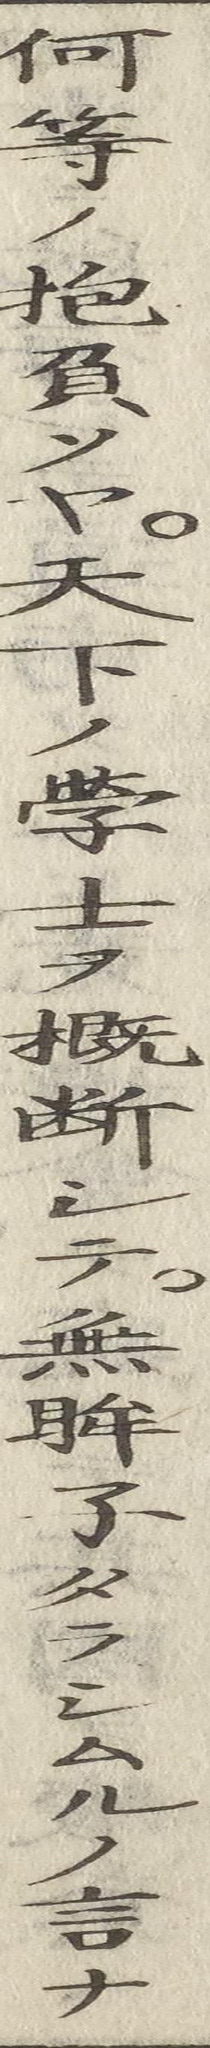何等ノ抱負ソヤ。天下ノ学士ヲ概断シテ。無眸子タラシムルノ言ナ
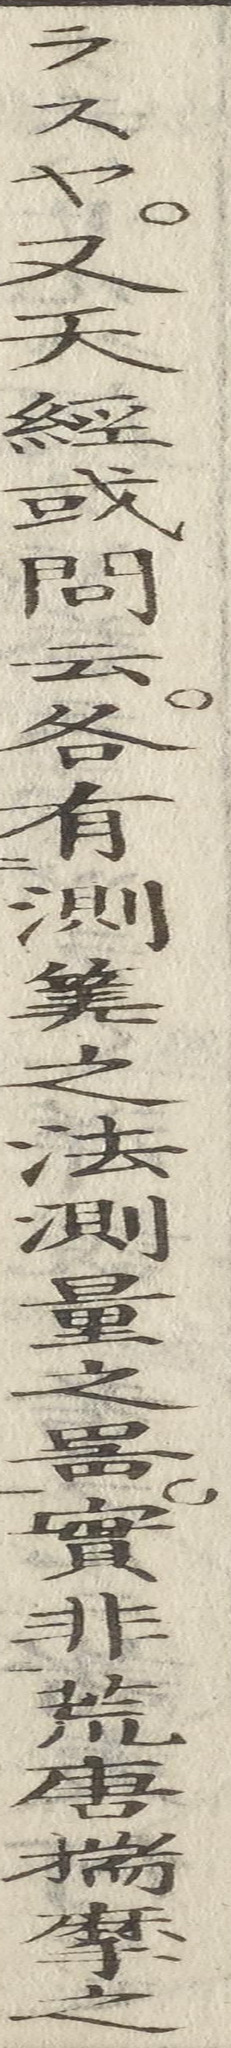ラスヤ。又天経或問云。各有測算之法測量之器。実非荒唐揣摩之
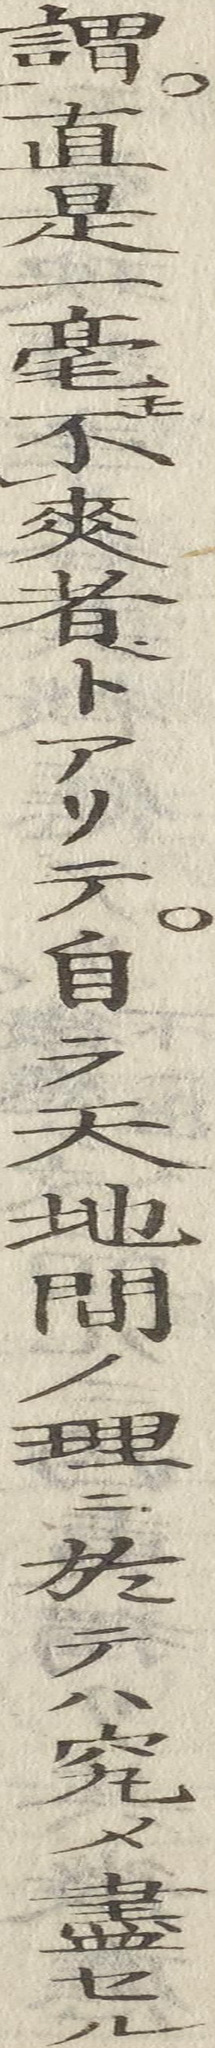謂。直是一毫不爽者トアリテ。自ラ天地間ノ理ニ於テハ究メ尽セル
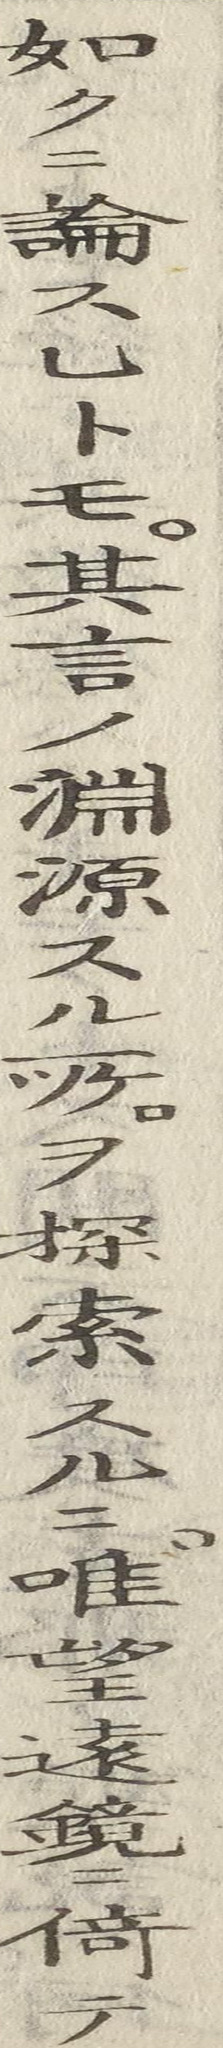如クニ論スレトモ。其言ノ淵源スル所。ヲ探索スルニ。唯望遠鏡ニ倚テ
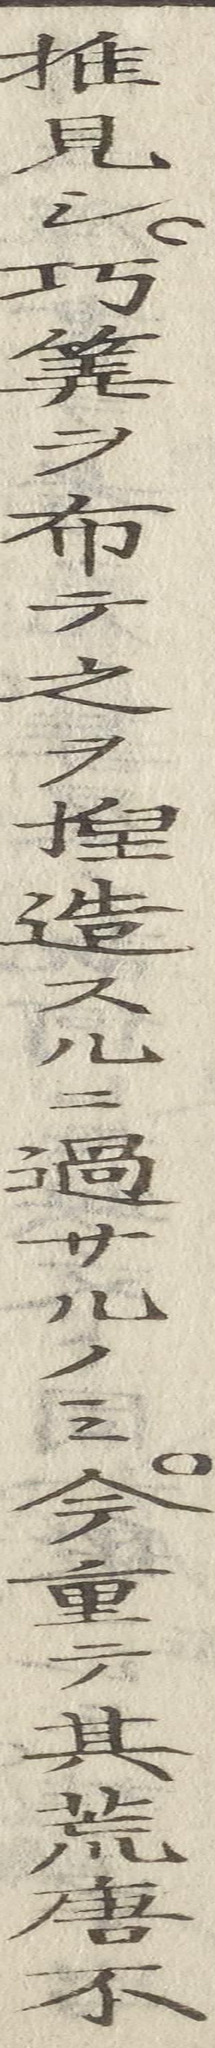推見シ。巧算ヲ布テ之ヲ捏造スルニ過サルノミ。今重テ其荒唐不
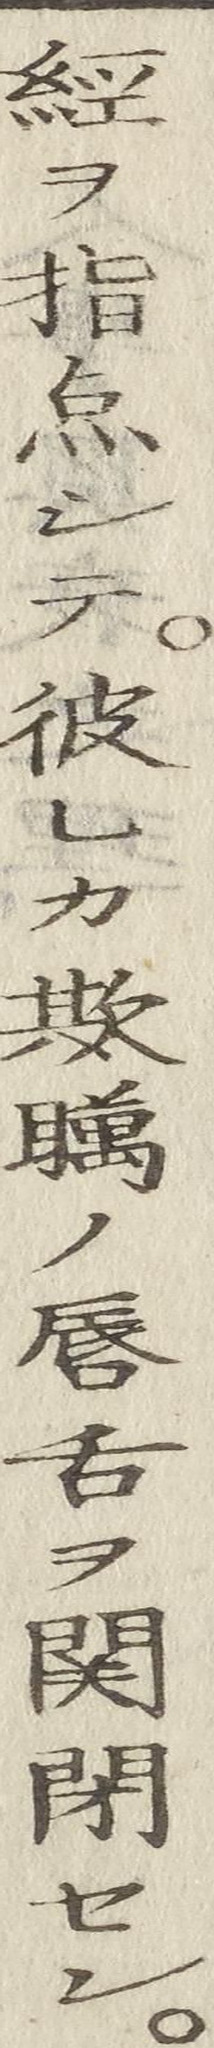経ヲ指点シテ。彼レカ欺瞞ノ唇舌ヲ関閉セン。
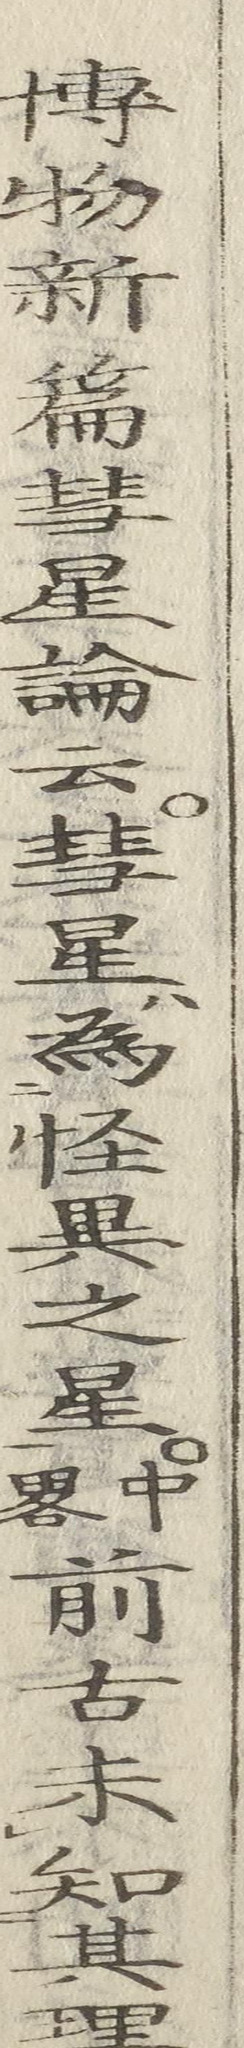博物新篇彗星論云。彗星為怪異之星。中略前古未知其理

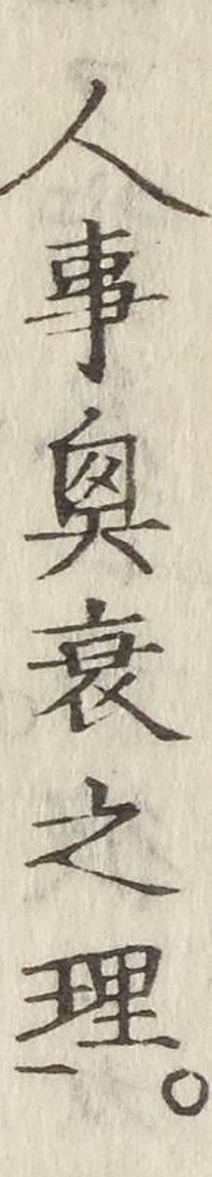人事匇衰之理。
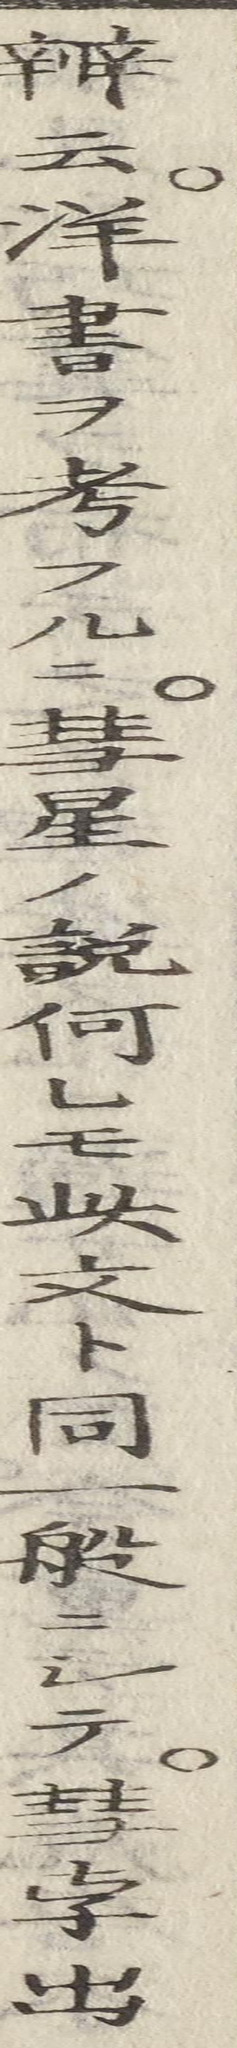弁云。洋書ヲ考フルニ。彗星ノ説何レモ此文ト同一般ニシテ。彗孛出
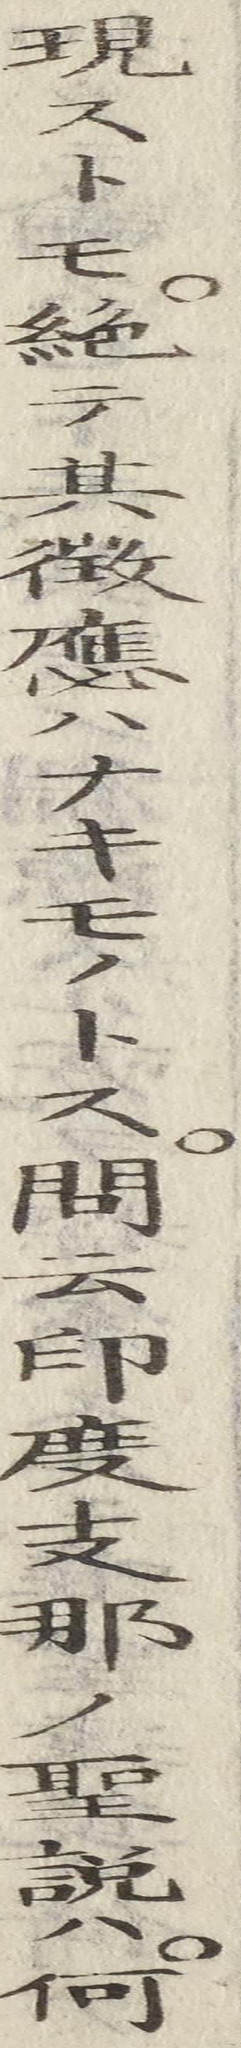現ストモ。絶テ其徴応ハナキモノトス。問云印度支那ノ聖説ハ。何
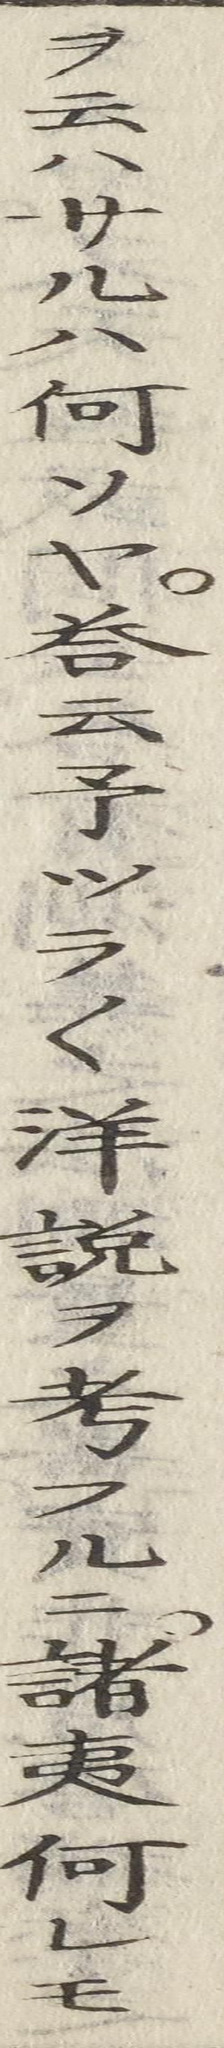ヲ云ハサルハ何ソヤ。答云予ツラ〳〵洋説ヲ考フルニ。諸夷何レモ
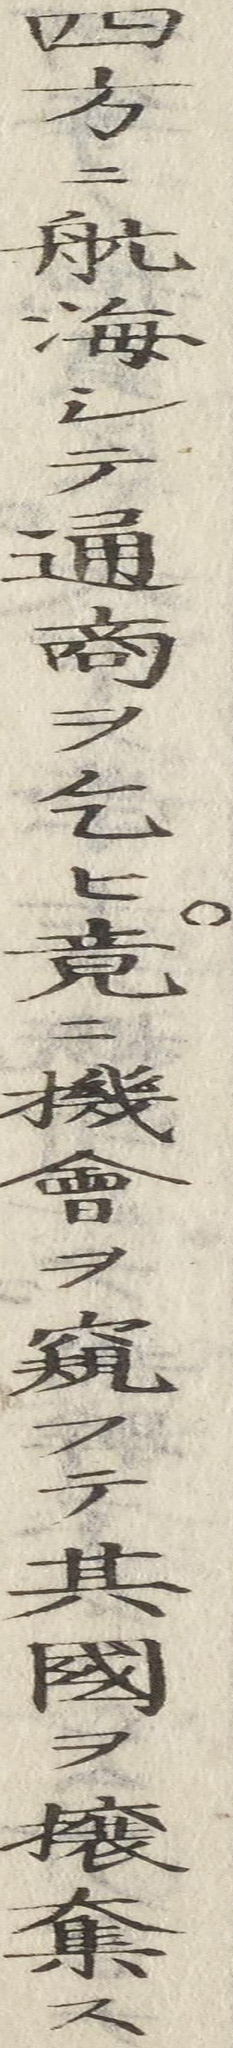四方ニ航海シテ通商ヲ乞ヒ。竟ニ機会ヲ窺フテ其国ヲ攘奪ス
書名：護法新論　中
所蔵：東京大学地震研究所図書室 Earthquake Research Institute Library, The University of Tokyo, JAPAN
